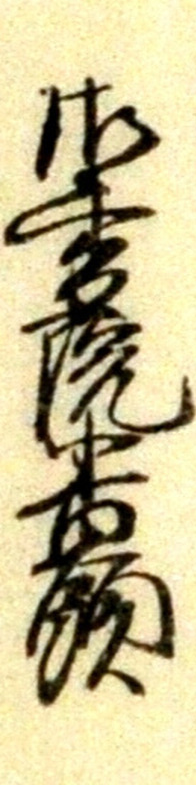御書院番頭
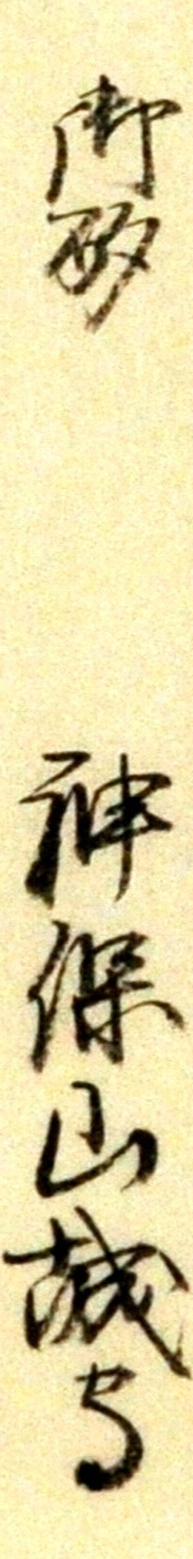御酌神保山城守
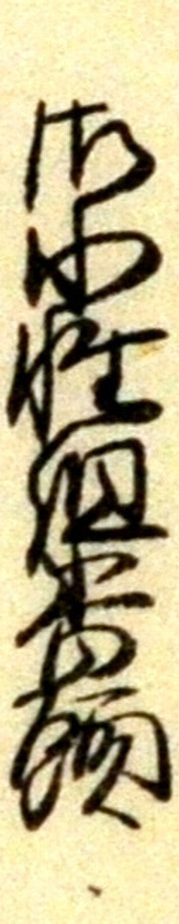御小性組番頭
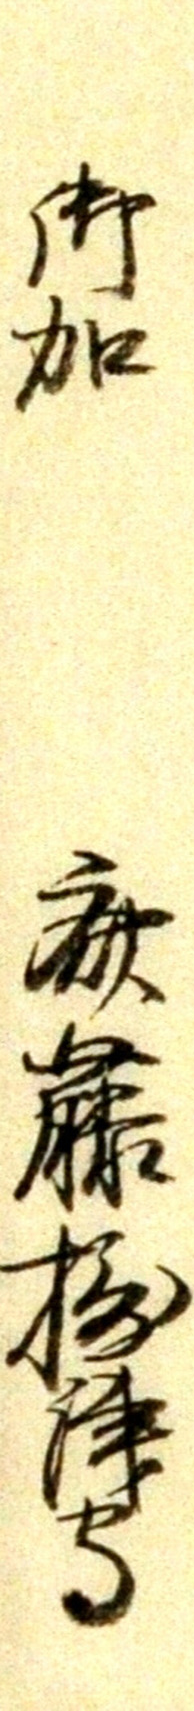御加斎藤摂津守
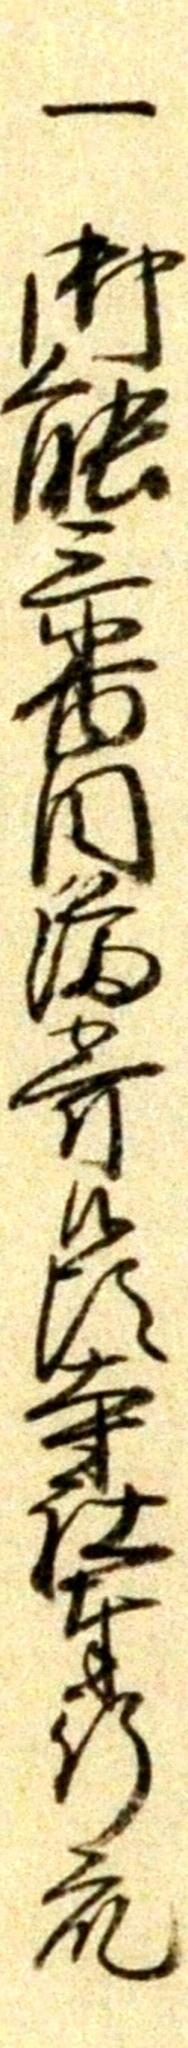一御能三番目済寄候頃寺社奉行衆
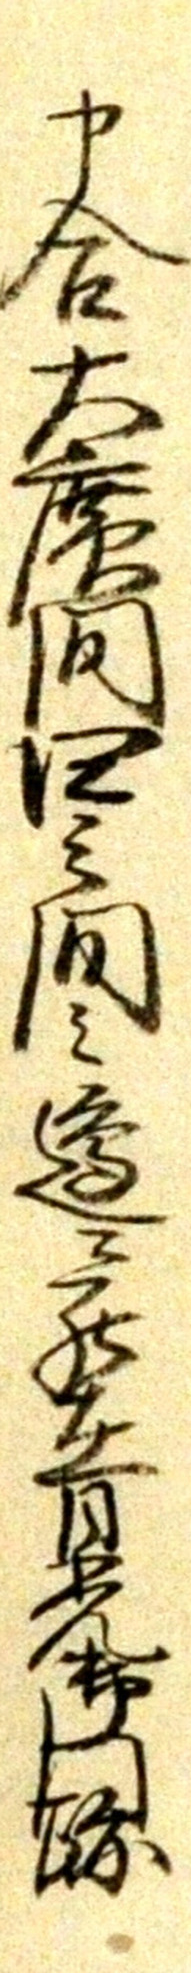申合大広間四之間之辺ニ罷在日光御門跡
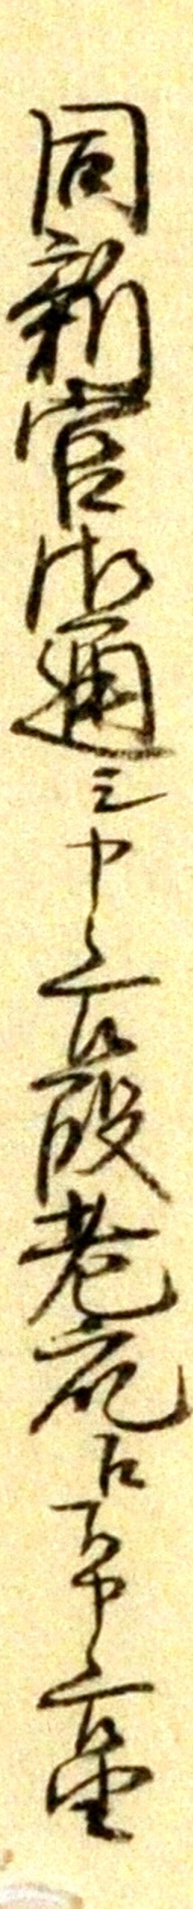同新官御通シ申上候段老衆へ被申上候由
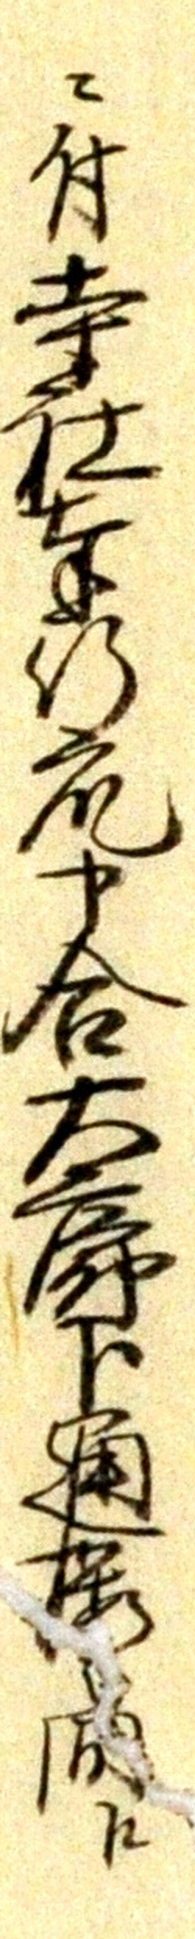ニ付寺社奉行衆申合大廊下通桜之間え
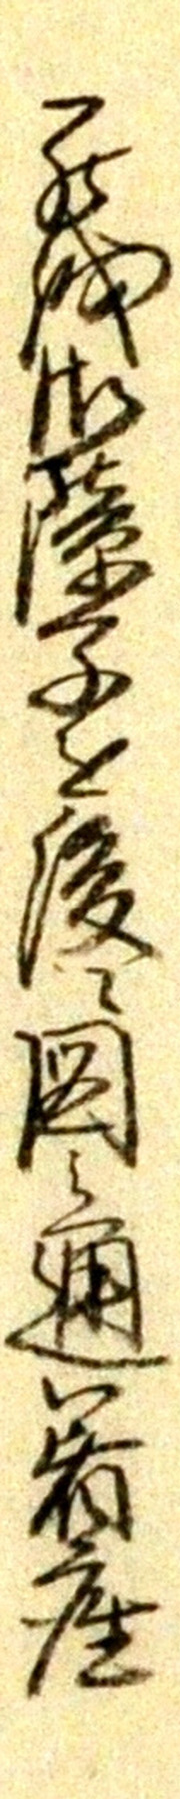罷越御障子を後ニ図之通着座
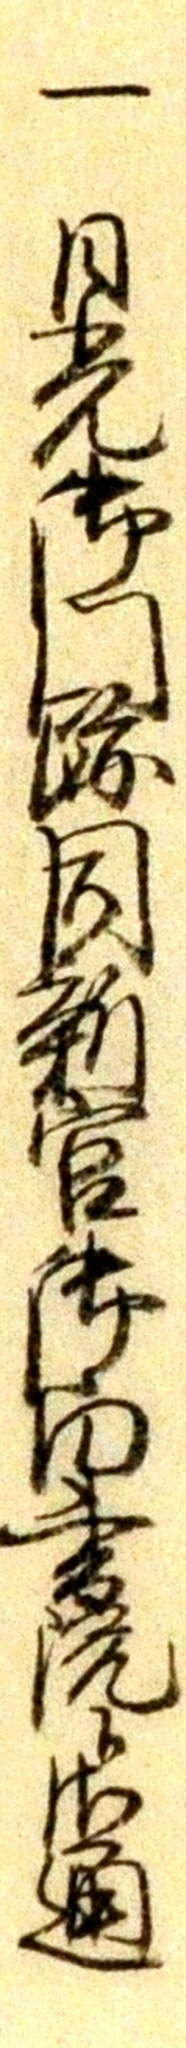一日光御門跡同新官御白書院え御通
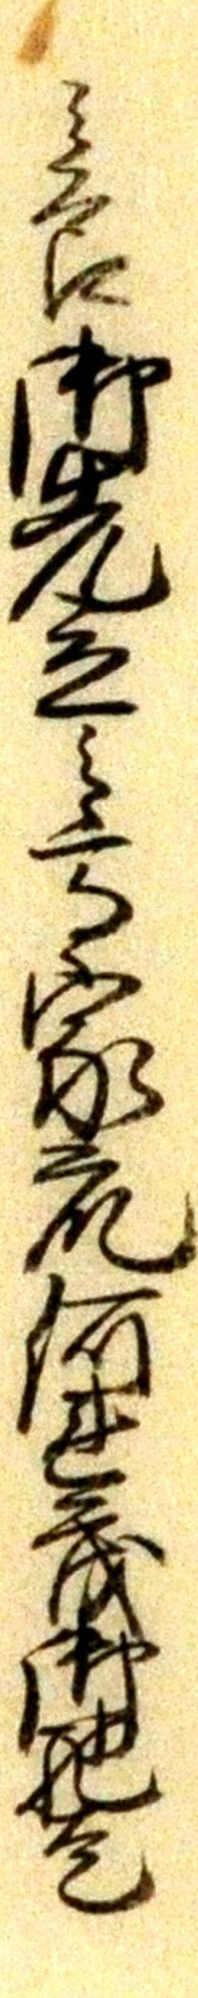之節御先立之高家衆何れも御馳走
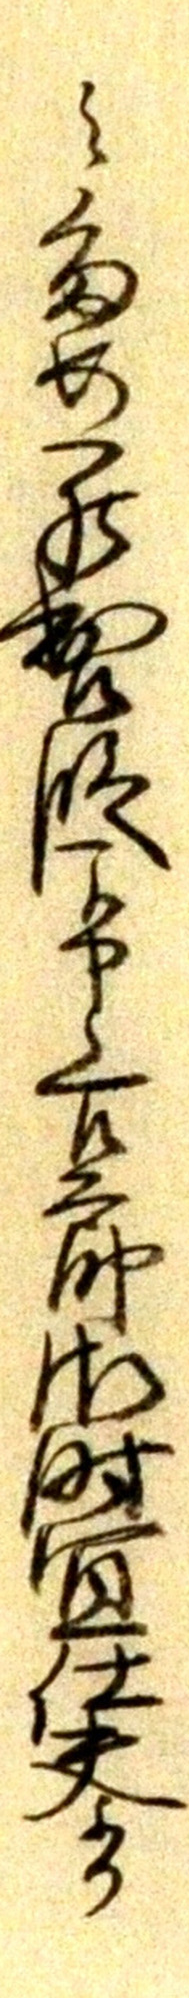之ため罷出候段被申上候節御時宜仕其より
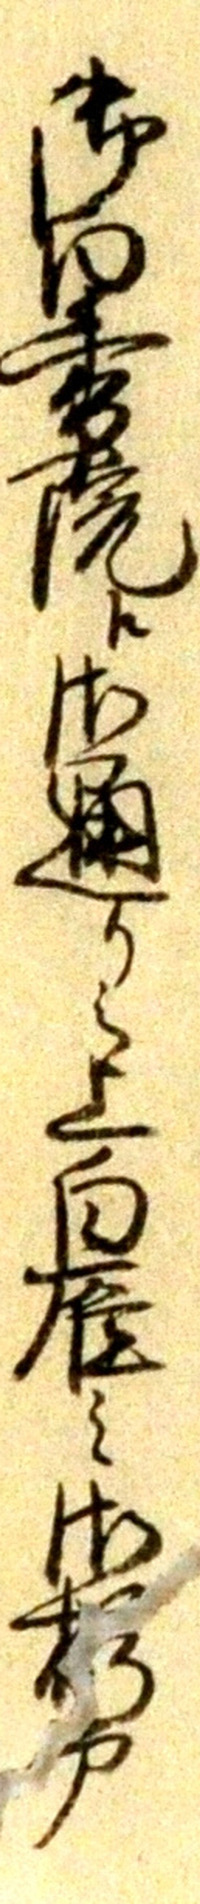御白書院え御通り之上白雁之御杉戸
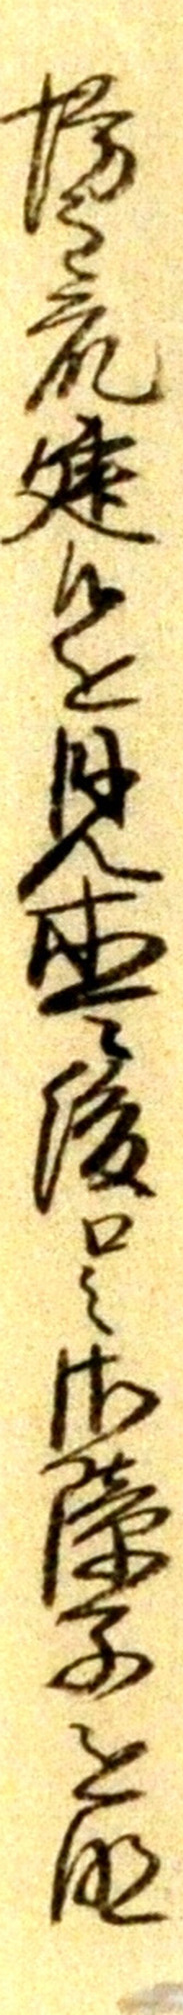坊主衆建候を見直ニ後ロ之御障子を明
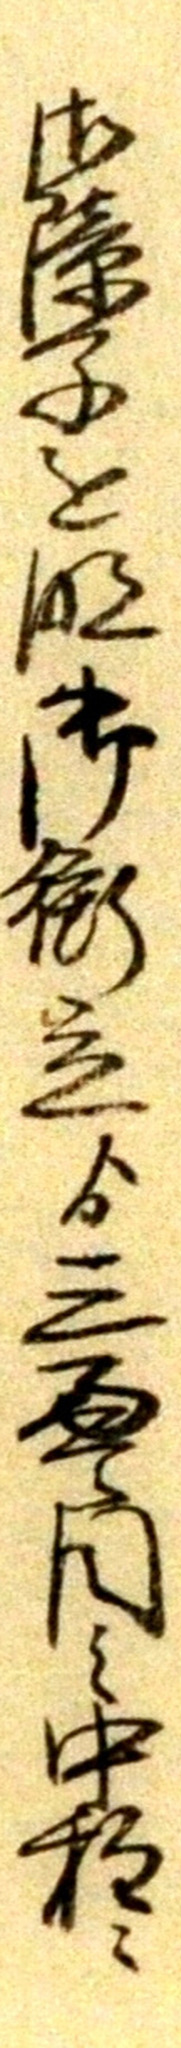御障子を明御衝立ゟ三畳目之中程ニ
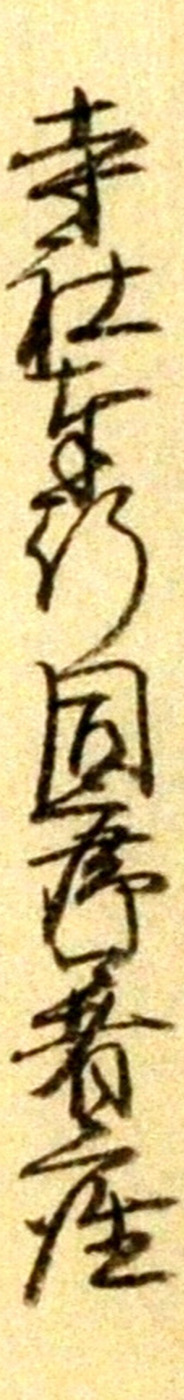寺社奉行同席着座
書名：御移徒相済御祝儀御能ノ節ノ留外
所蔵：伊那市立高遠町図書館・合同会社AMANE
